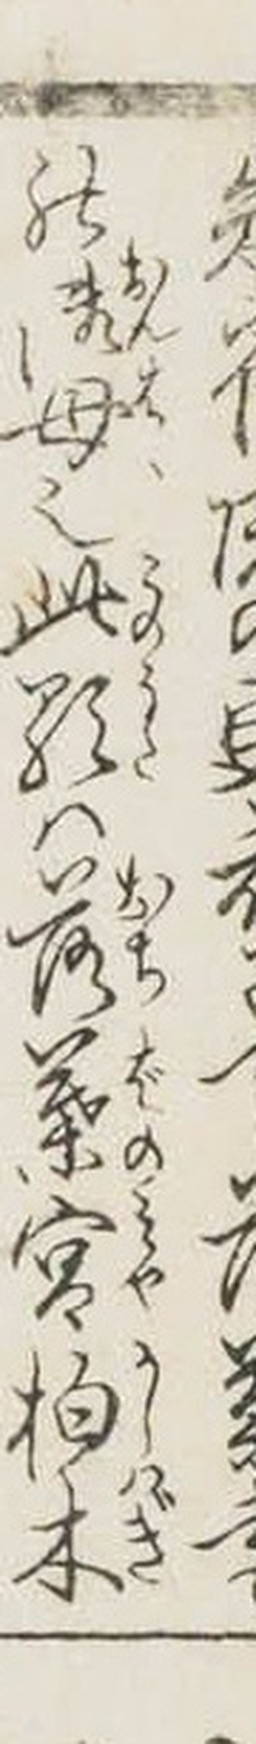の御母也此歌は落葉宮柏木
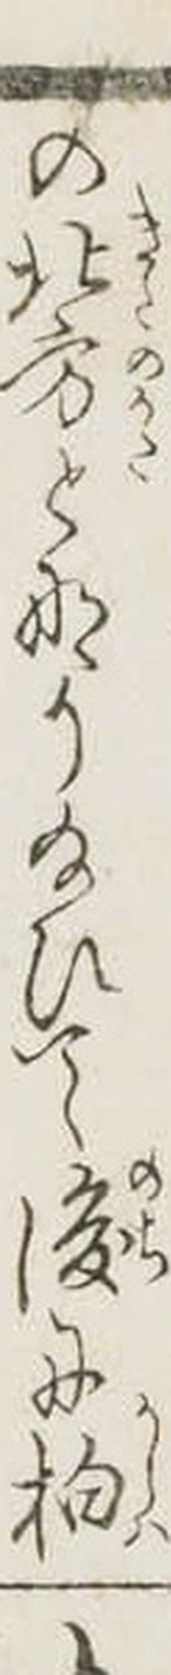の北方となり給ひて後に柏
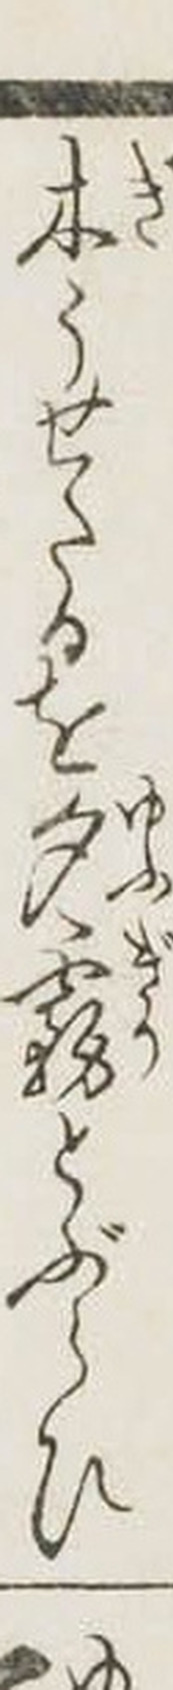木うせたるを夕霧とぶらひ
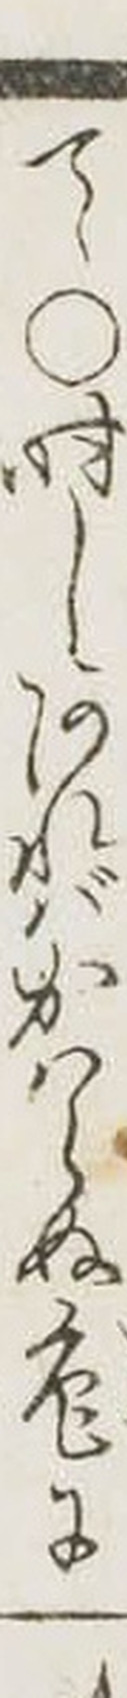て○時しあればかはらぬ色に
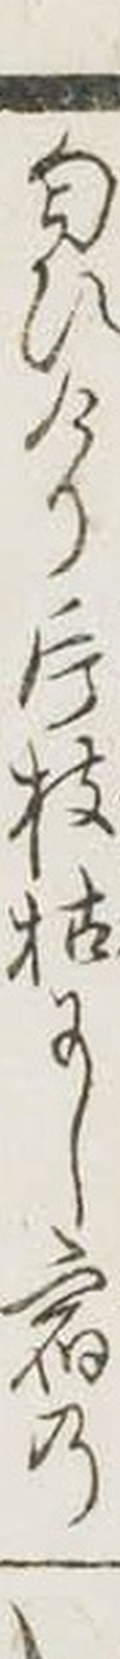匂ひけり片枝枯にし宿の
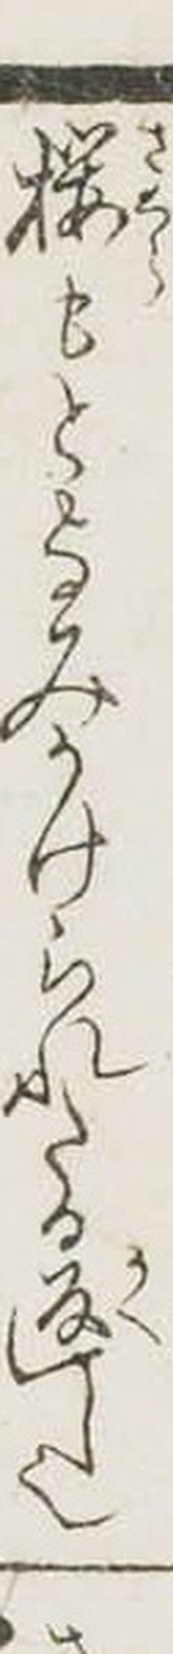桜もとよみかけられたる返し也
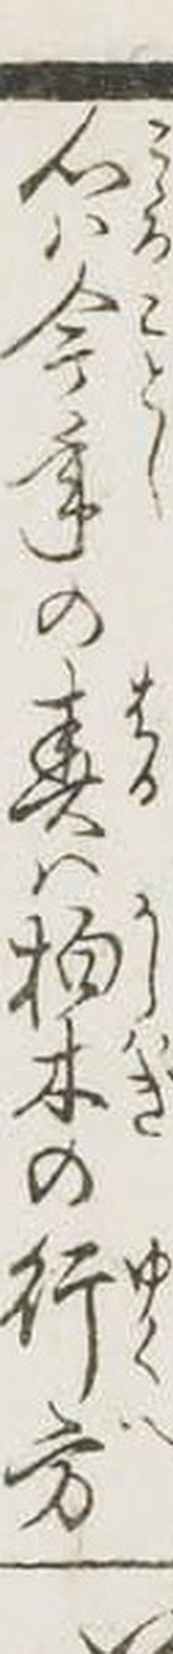心は今年の春は柏木の行方
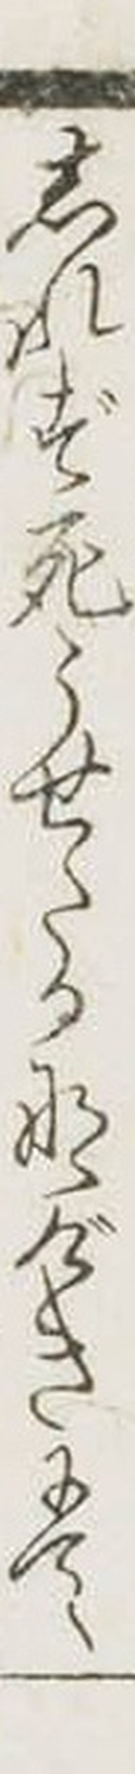しれず死うせたるなげきは
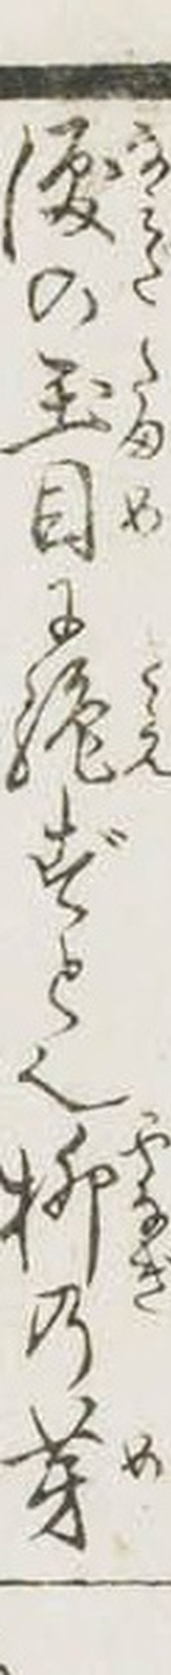涙の玉目に絶ずと也柳の芽
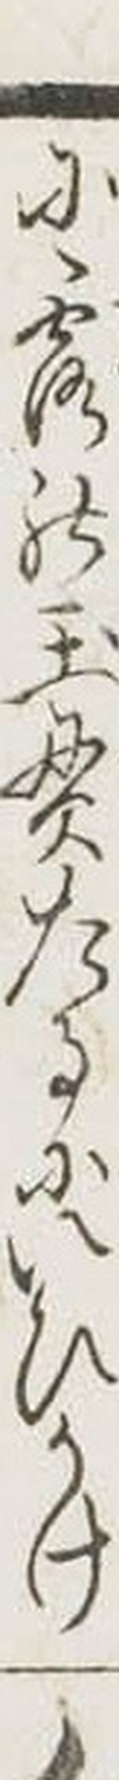に露の玉貫たるにいひかけ
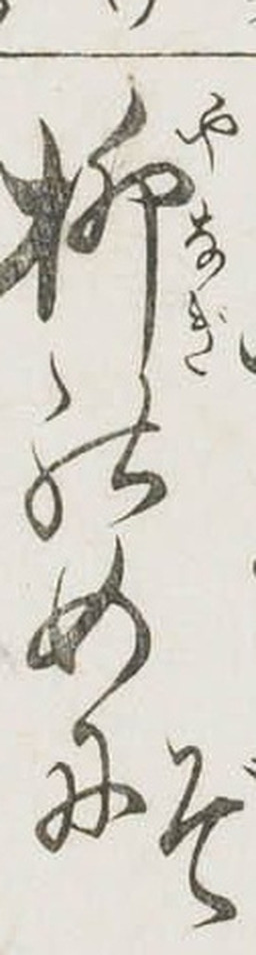柳のめに
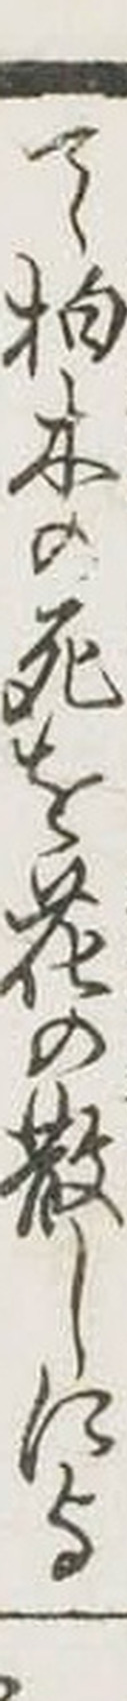て柏木の死を花の散しによ
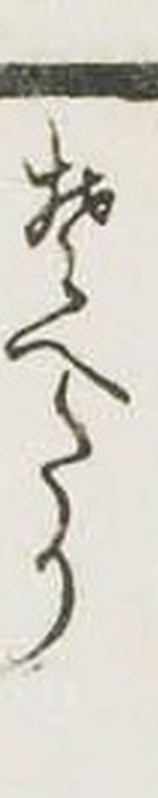そへたり
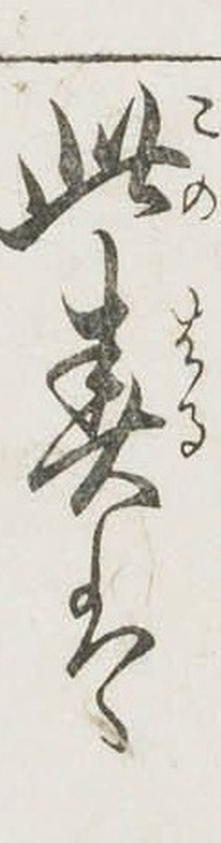此春は
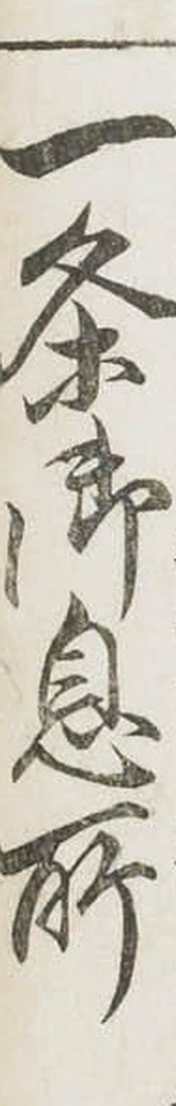一条御息所
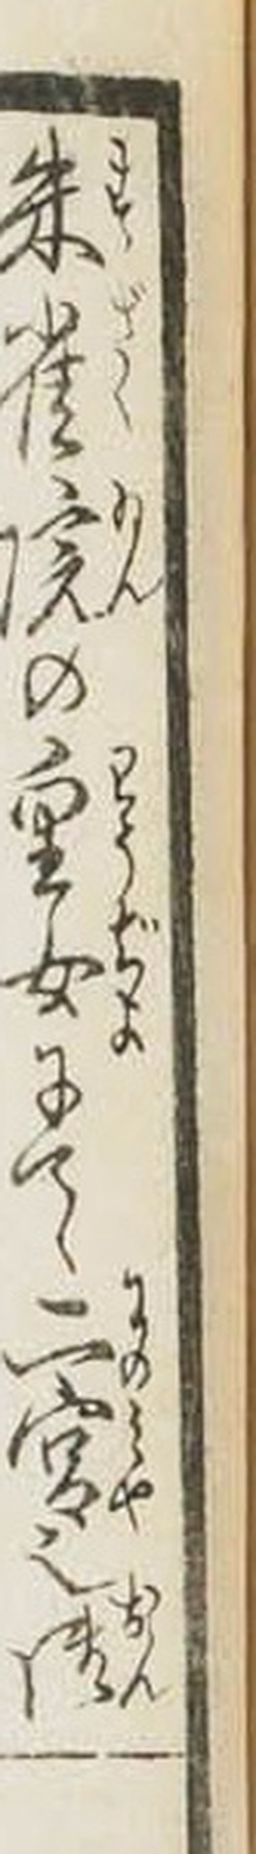朱雀院の皇女にて二宮也御
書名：源氏百人一首
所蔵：東京学芸大学教育コンテンツアーカイブ
